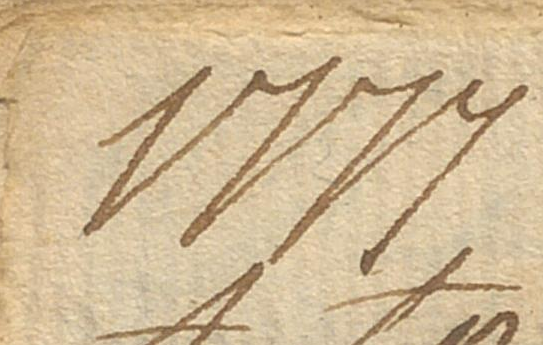1777
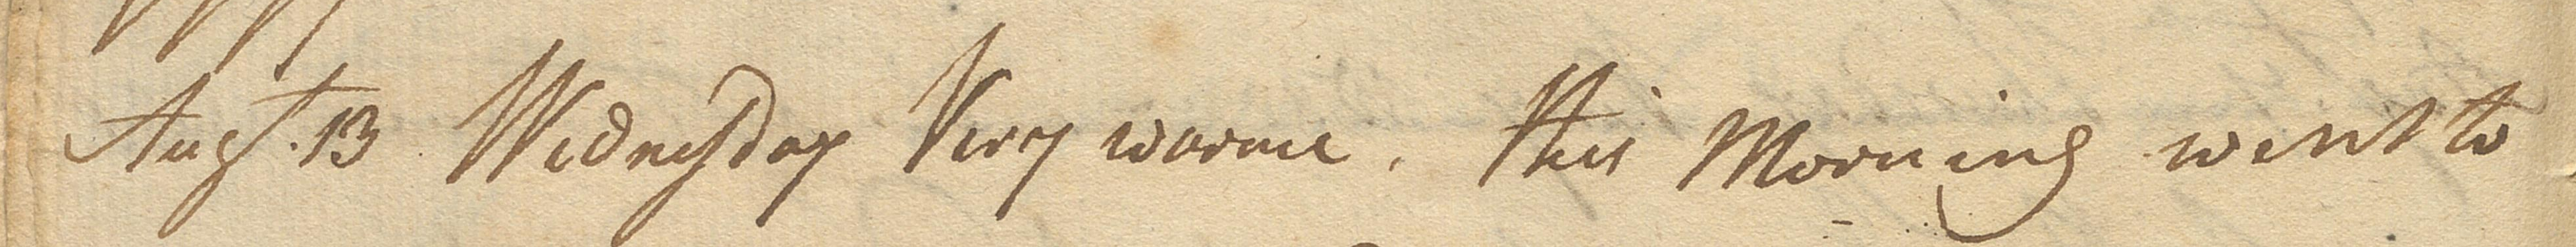Aug^t. 13 Wednesday Very warme. this Morning went to
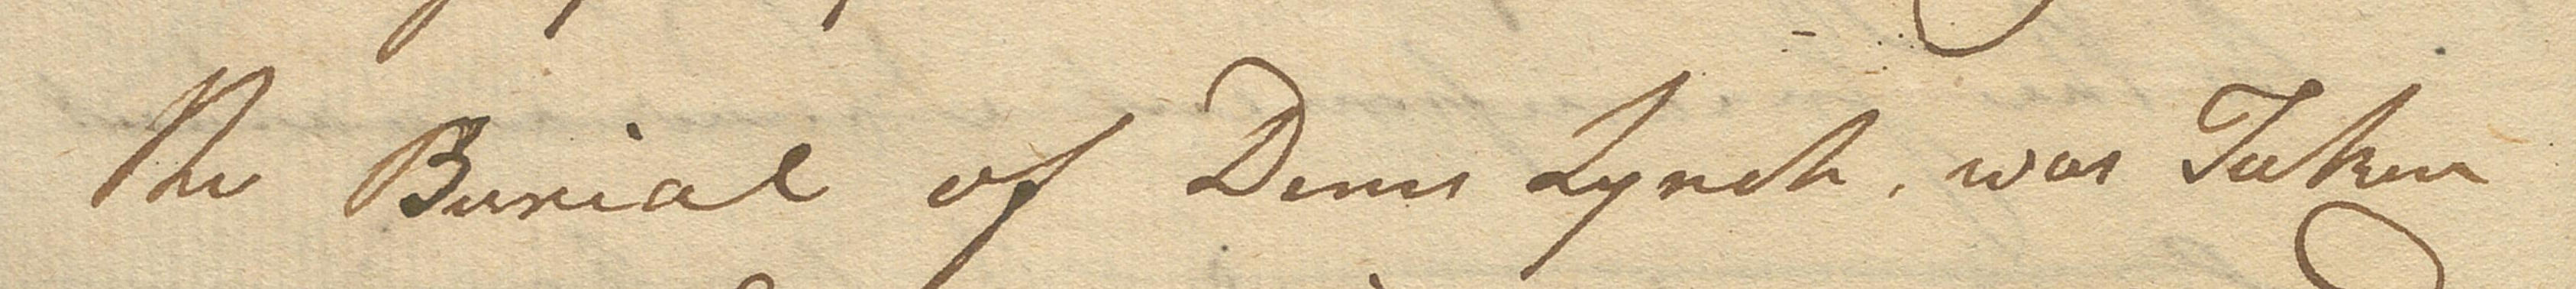the Burial of Dines Lynch, was Taken
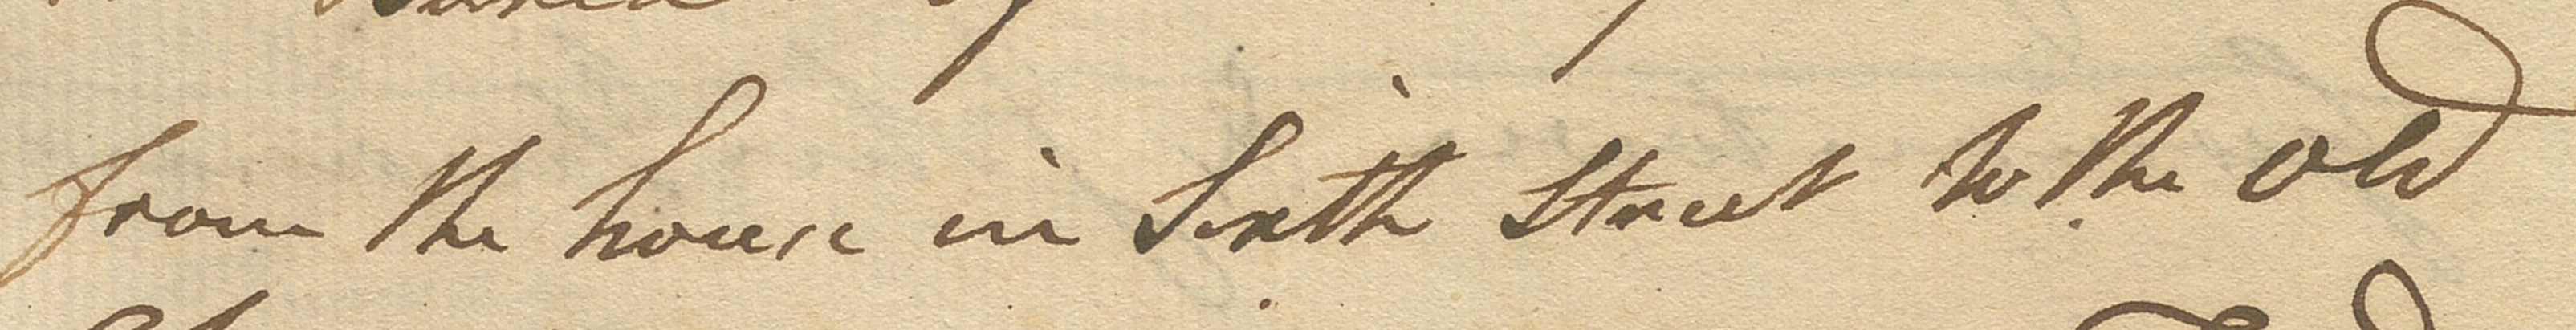from the house in Sixth Street to the old
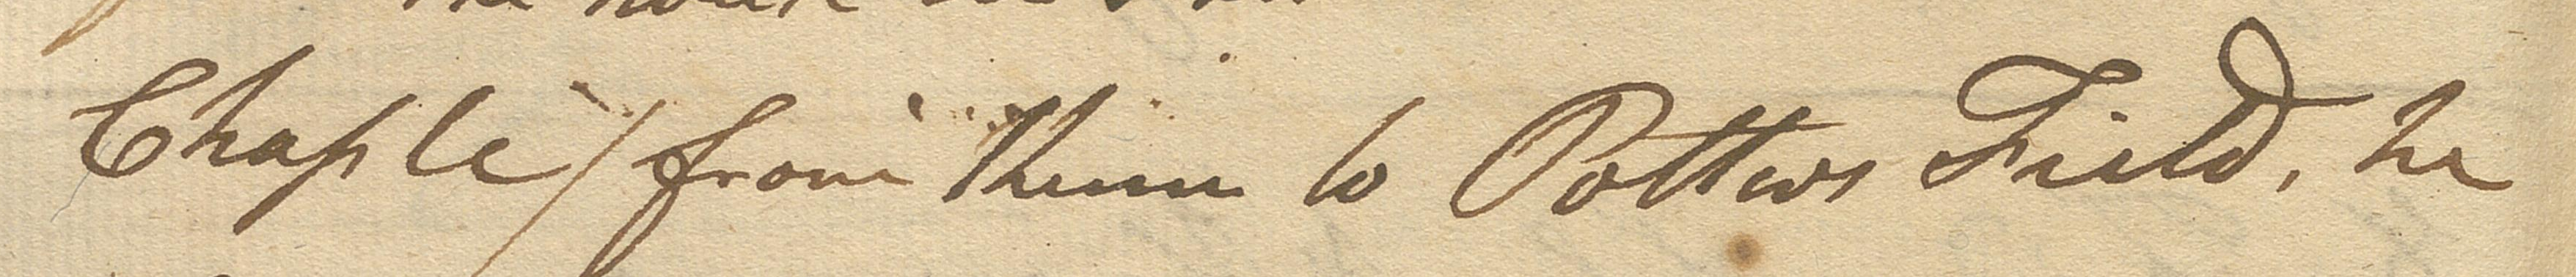Chaple / from thence to Potters Field, he
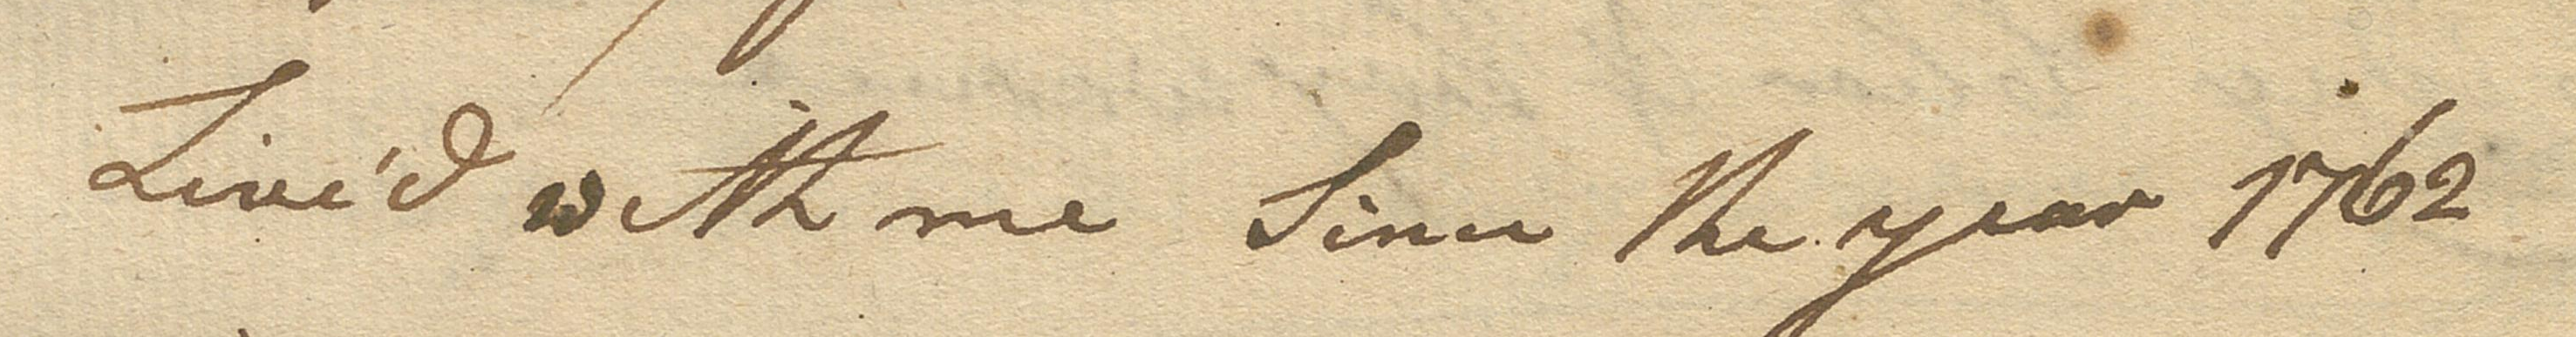Live'd with me Since the year 1762
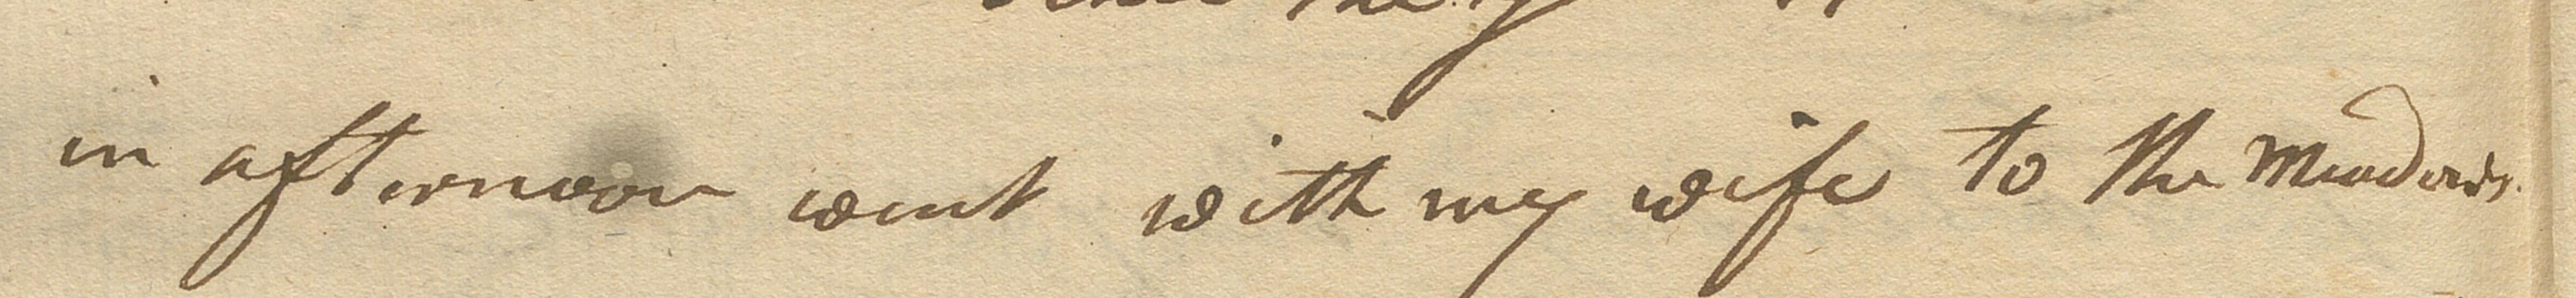in afternoon went with my wife to the Meadows
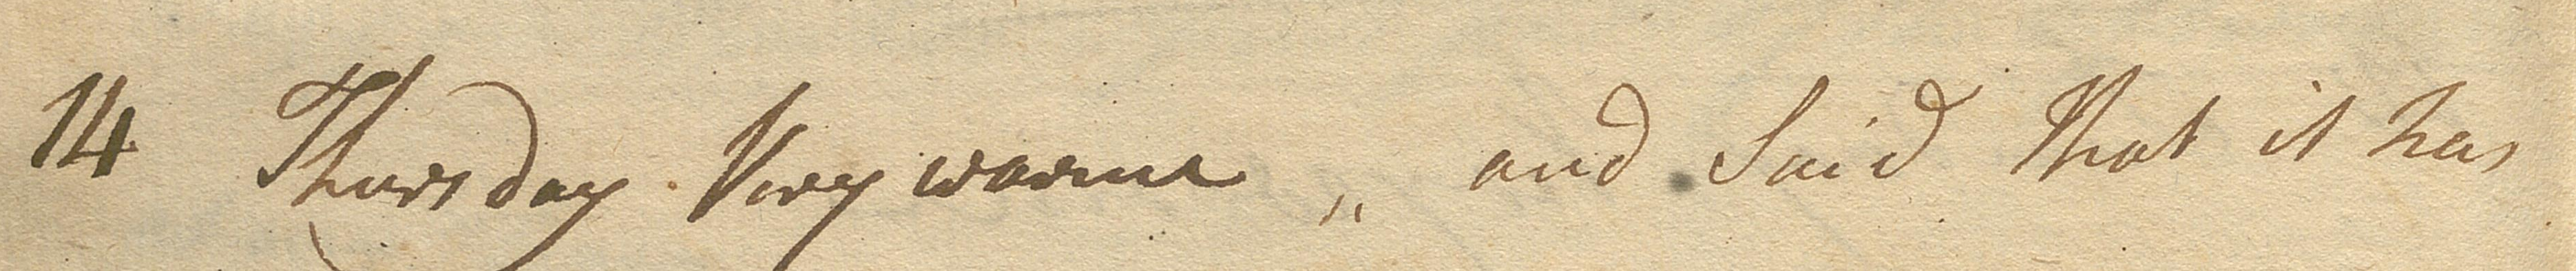14 Thursday Very warme, and said that it has
